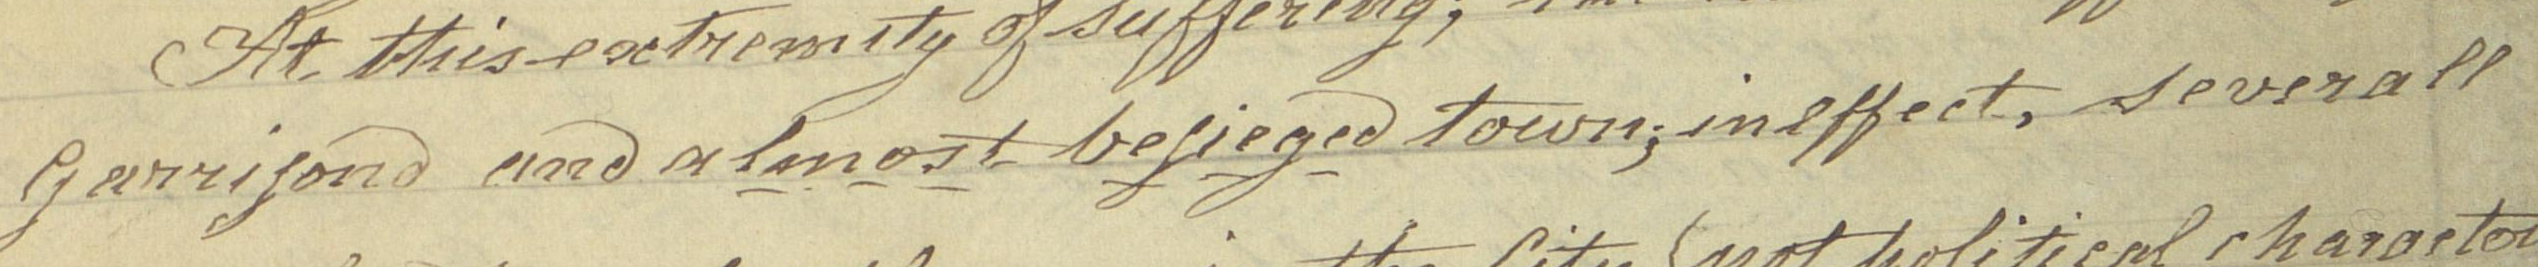Garrisond and almost besieged town; in effect, severall
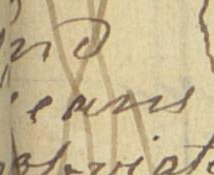-cans
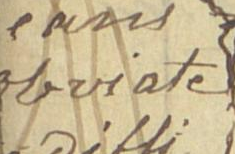obviate
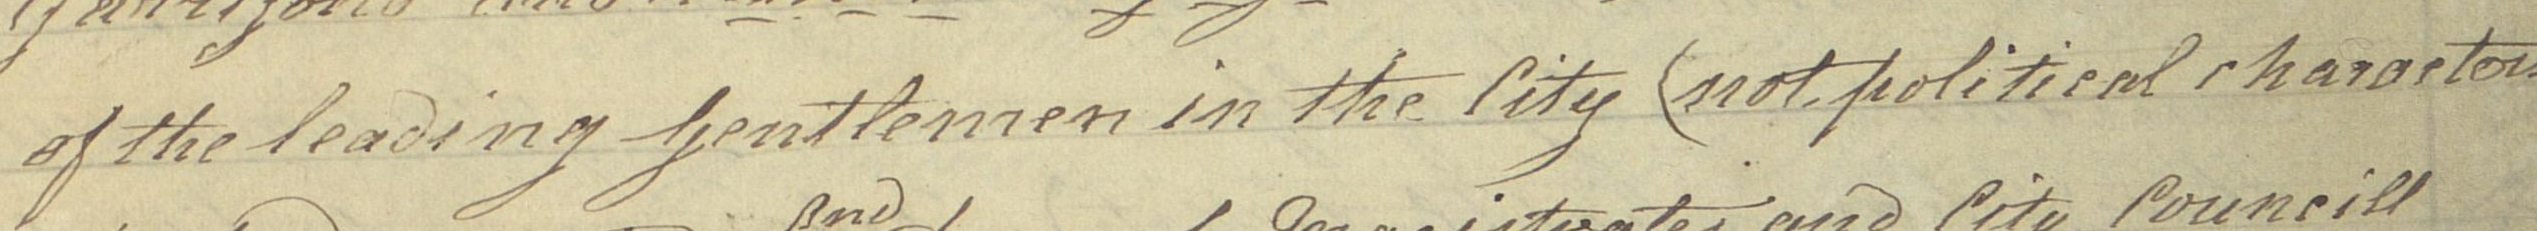of the leading Gentlemen in the City (not political characters
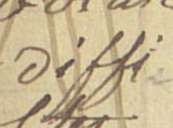diffi-
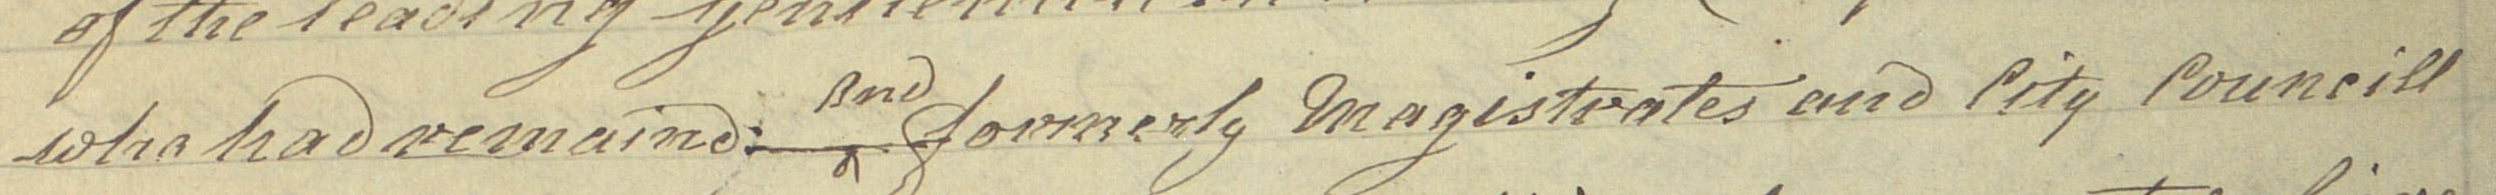who had remaind: ^ formerly magistrates and City Councill
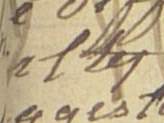-alty
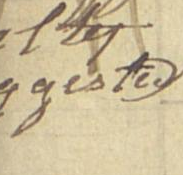-lty
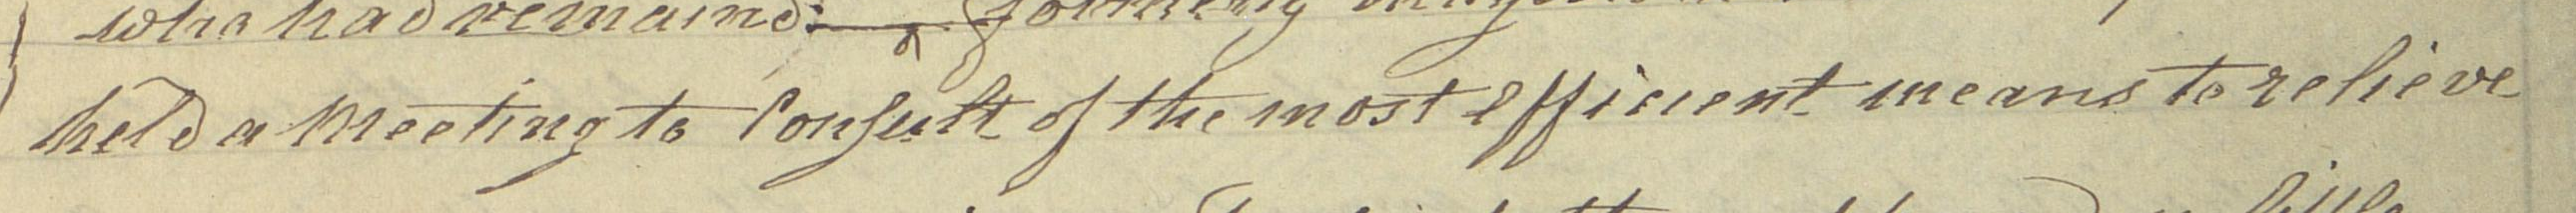held a meeting to Consult of the most efficient means to relieve
